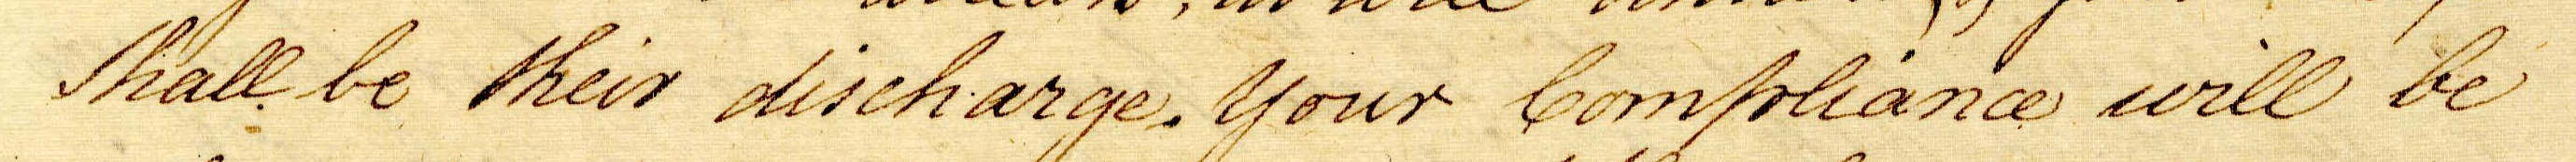Shall be their discharge, Your Compliance will be
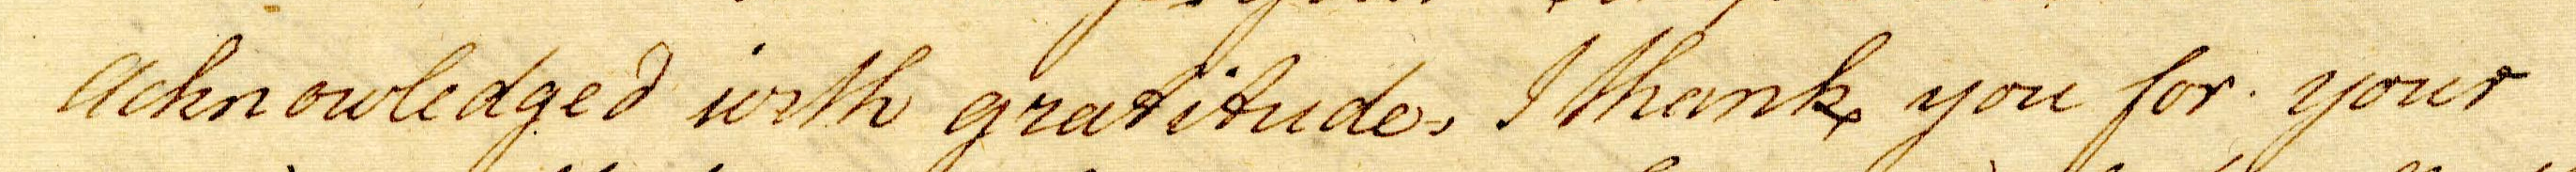Acknowledged with gratitude, I thank you for Your
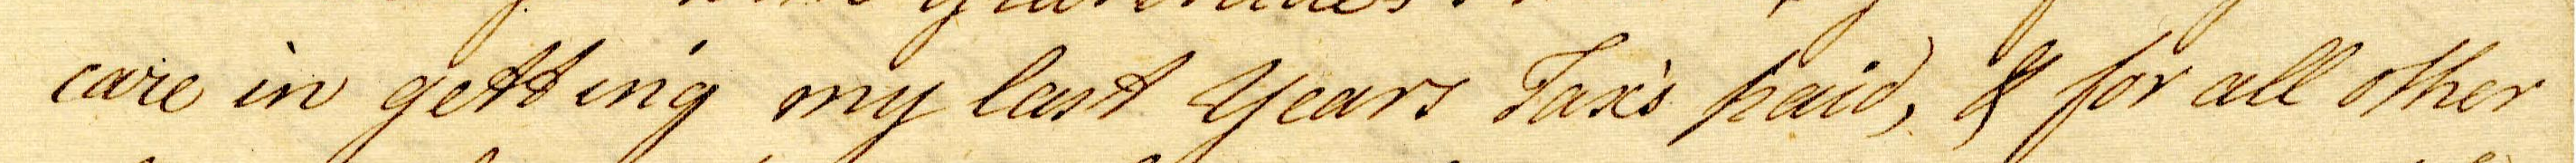care in getting my last Years Tax's paid, & for all other
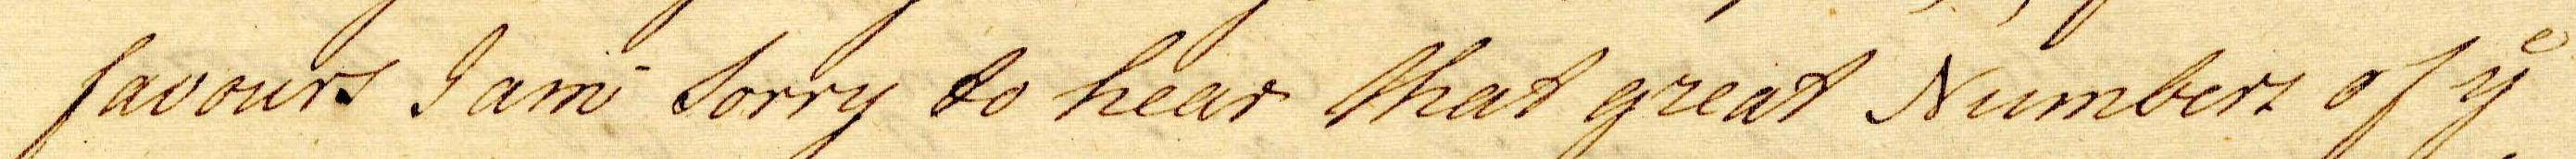favours I am Sorry to hear that great Numbers of y^e
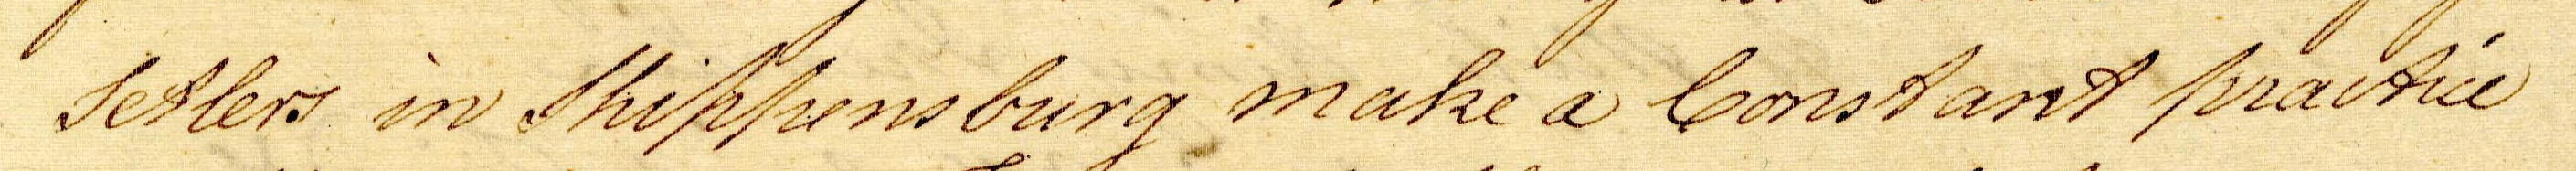Setlers in Shippensburg make a Constant practice
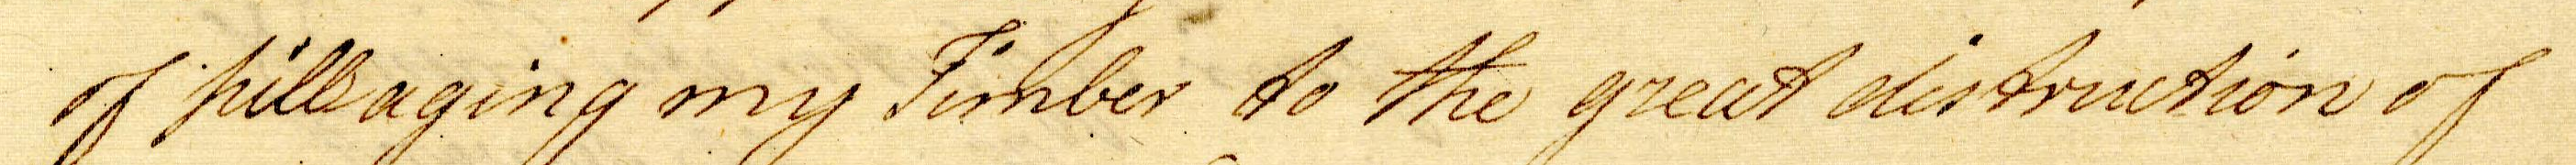of pill aging my Timber so the great distruction of
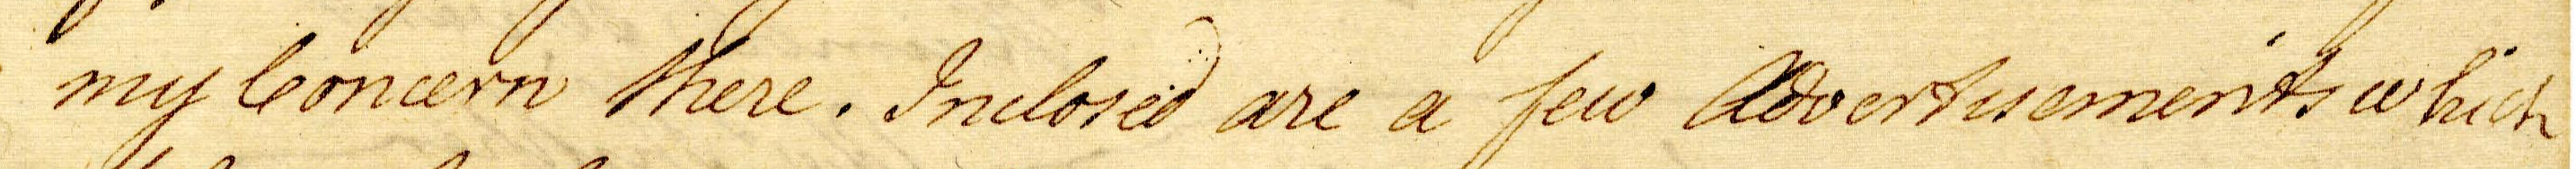my Concern there. Inclosed are a few Advertisements which
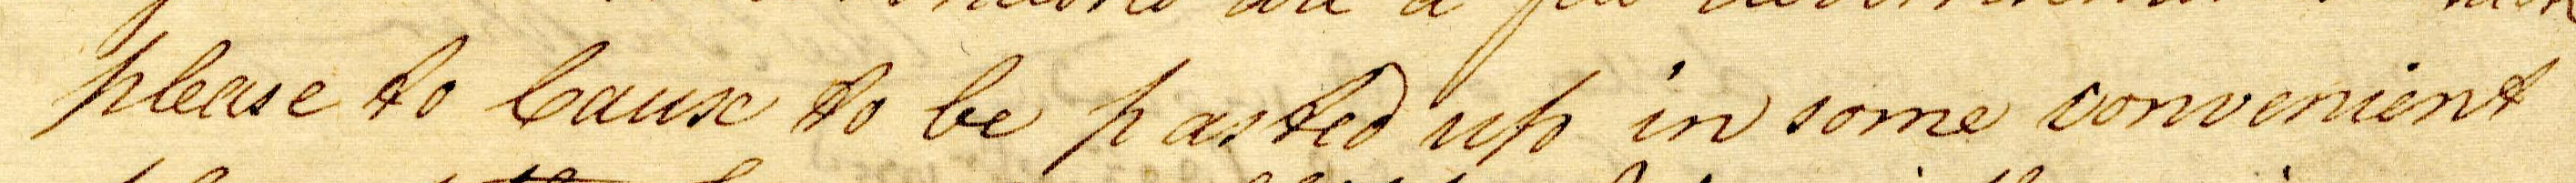please to Cause to be pasted up in some convenient
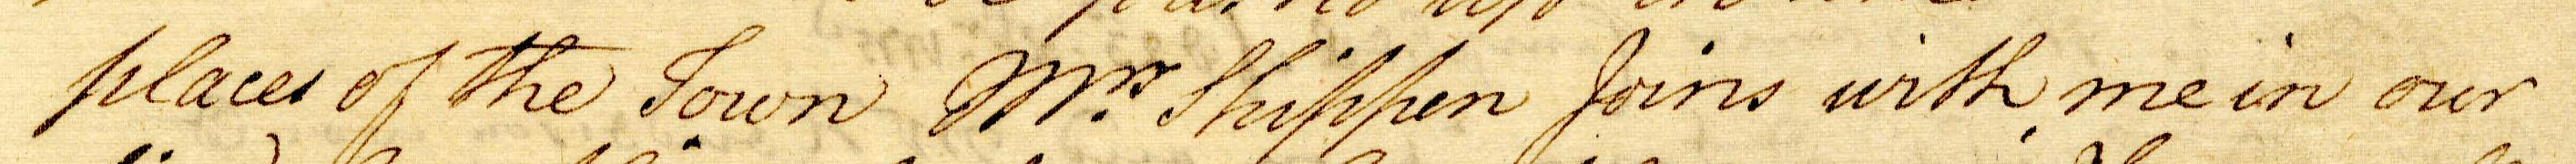places of the Town M^rs. Shippen Joins with me in our
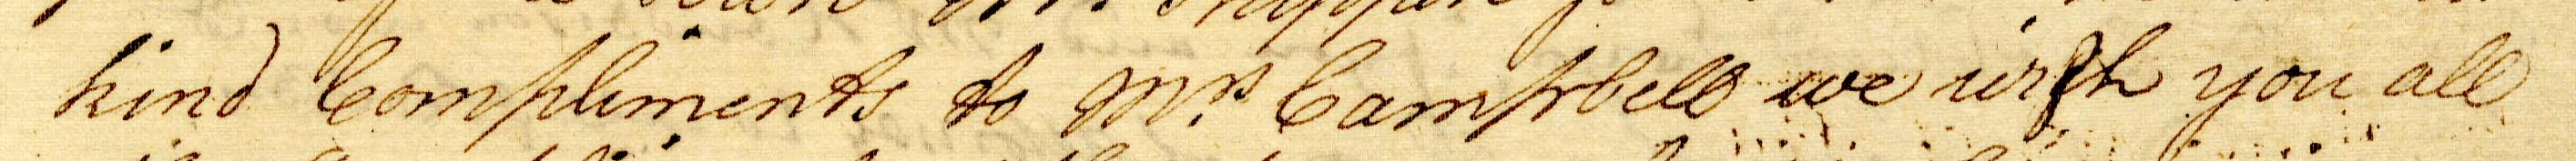kind Compliments to M^rs. Campbell we wish you all
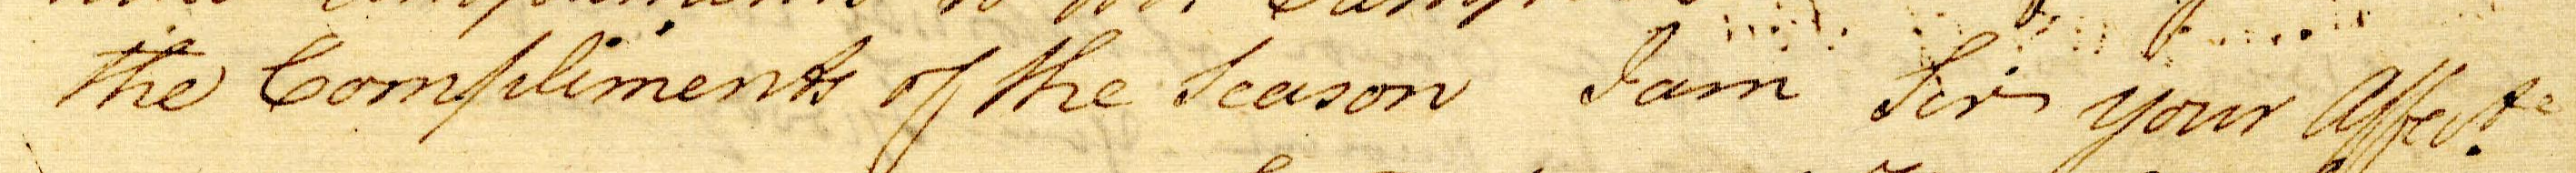the Compliments of the Season I am Sir Your Affec^te.
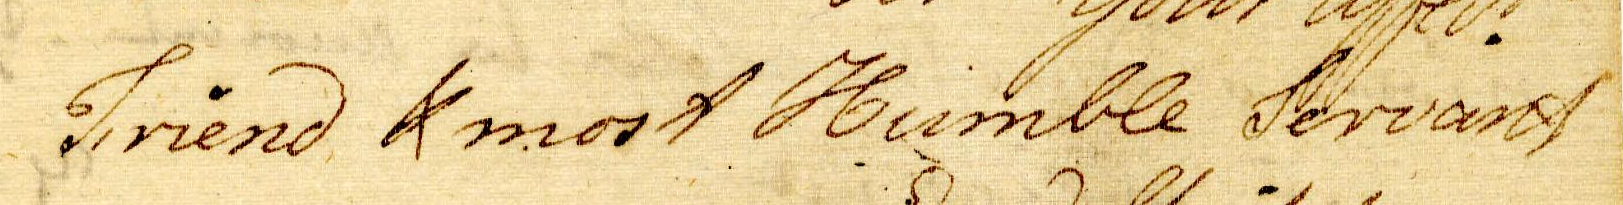Friend & most Humble Servant
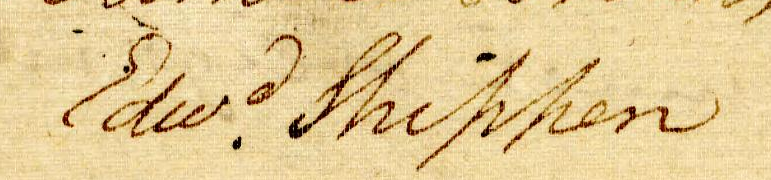Edw^d. Shippen
